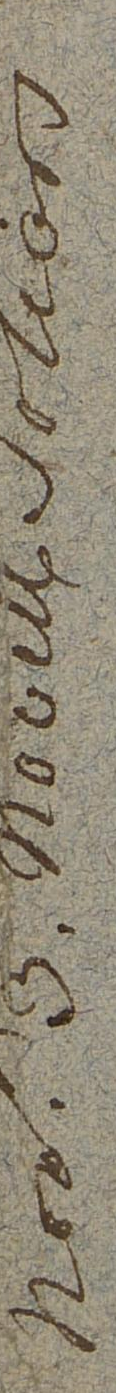Nov^r. 3. Novell Soliors
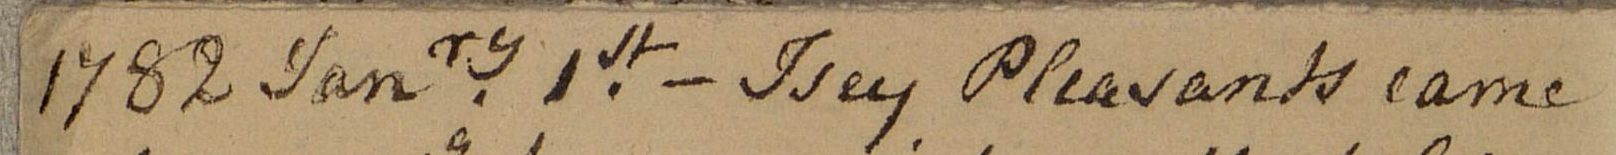1782 Jan^ry. 1^st.- Isey Pleasants came
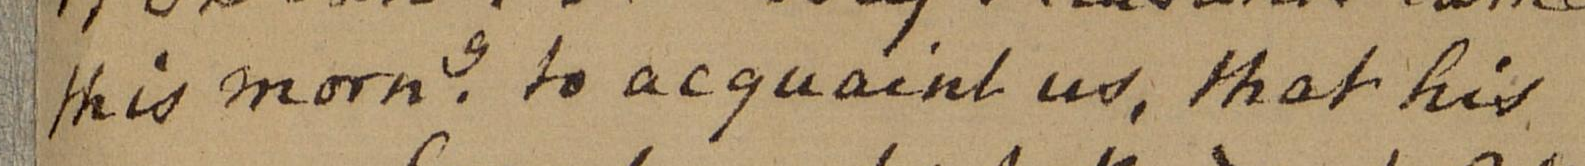this morn^g. to acquaint us, that his
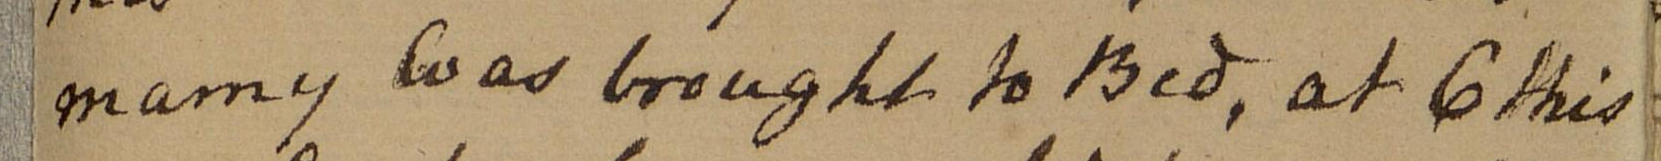mamy was brought to Bed, at 6 this
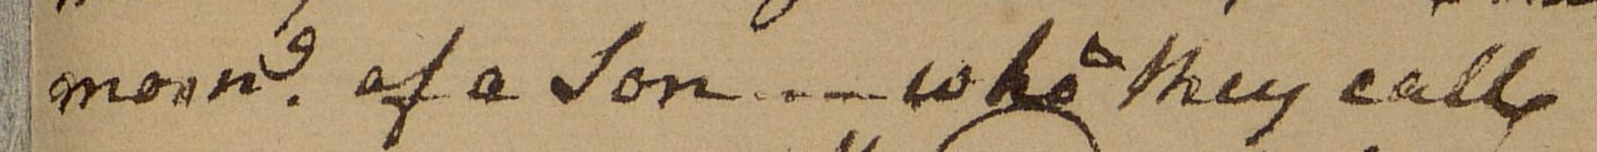morn^g of a Son.-- who they call
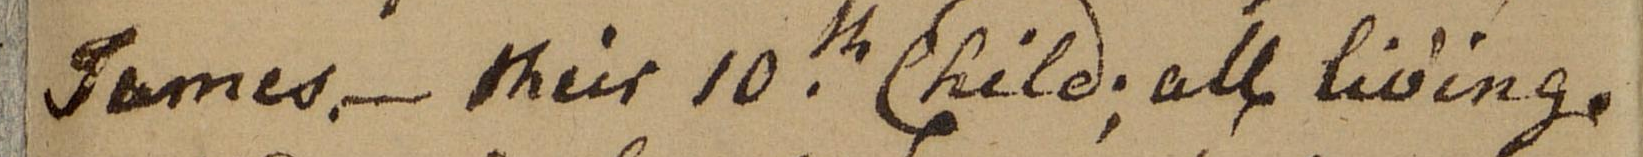James.- their 10^th. Child. all living.
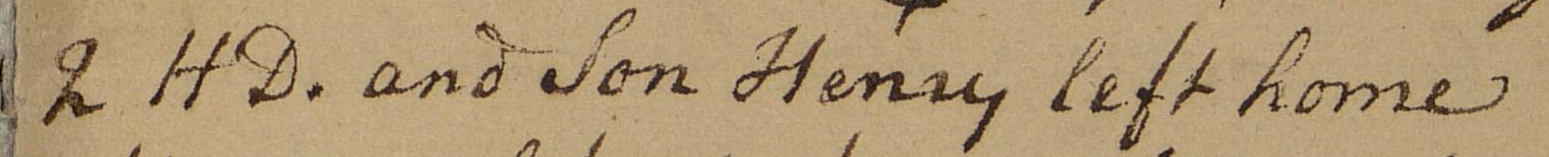2 HD. and Son Henry left home
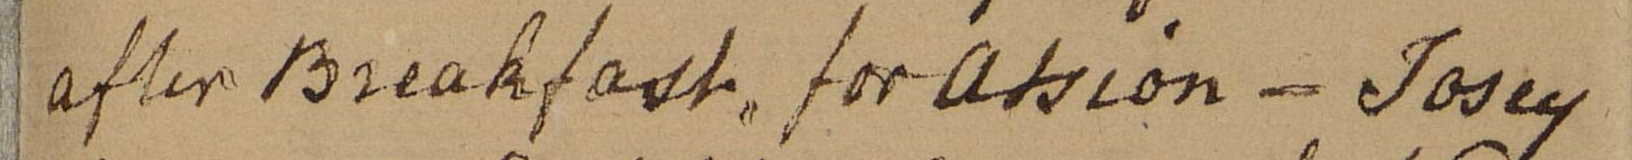after Breakfast, for Atsion- Josey
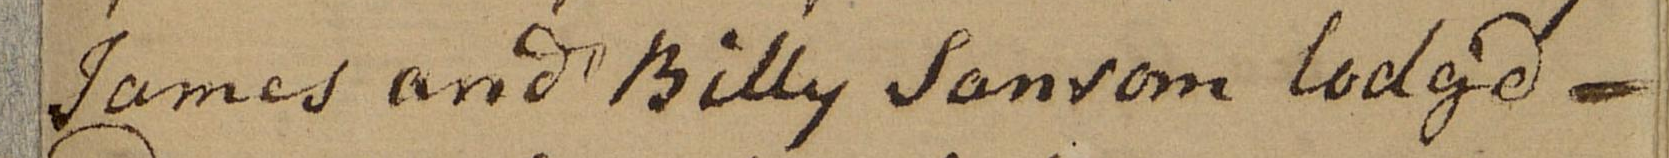James and Billy Sansom lodg'd-
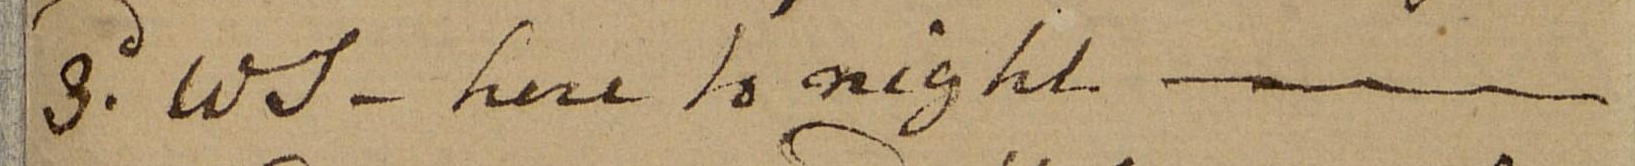3^d. W S- here to night.-
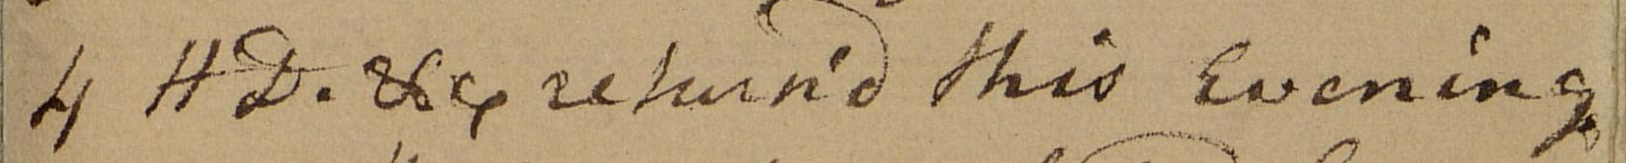4 HD. &c return'd this Evening.
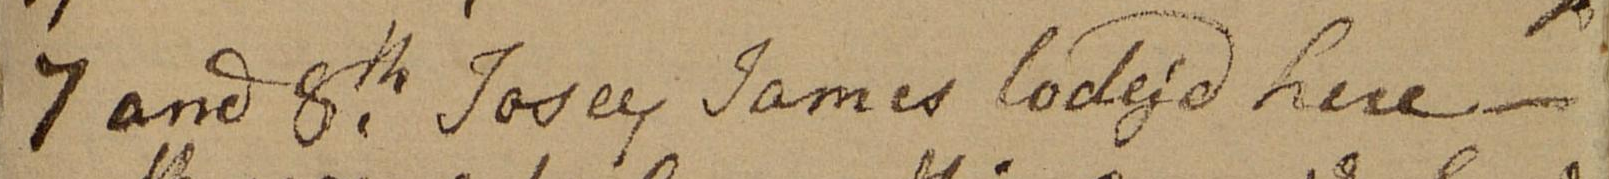7 and 8^th. Josey James lodg'd here-
